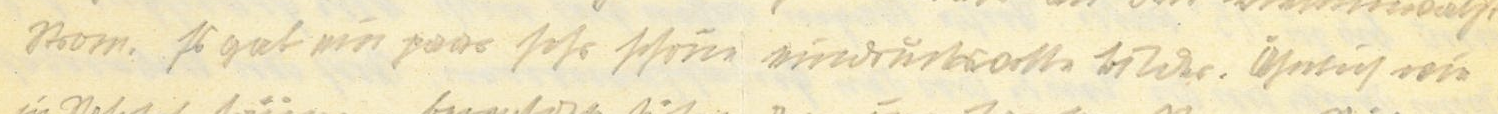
Strom. Es gab ein paar sehr schöne eindrucksvolle Bilder. Ähnlich wie
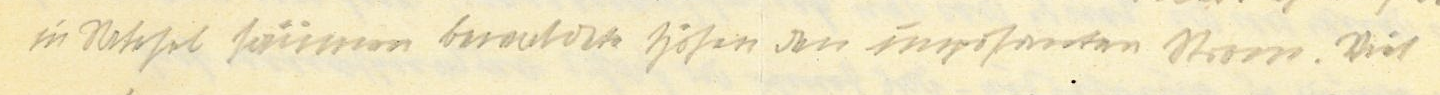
in N. säumen bewaldete Höhen den imposanten Strom. Viel
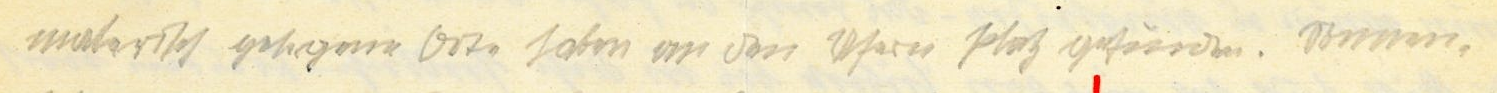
malerisch gelegene Orte haben an den Ufern Platz gefunden. Sonnen¬
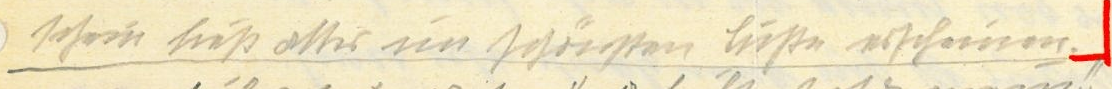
schein ließ alles im schönsten Lichte erscheinen.
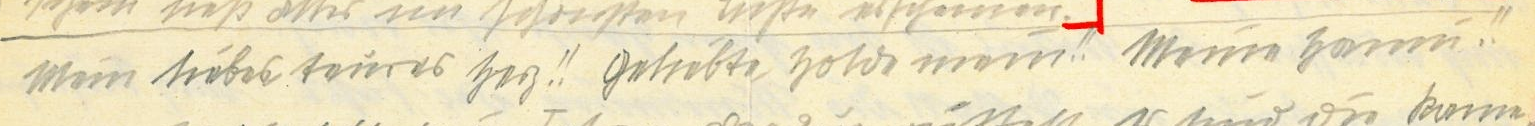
Mein liebes teures Herz!! Geliebte, Holde mein!! Meine !!
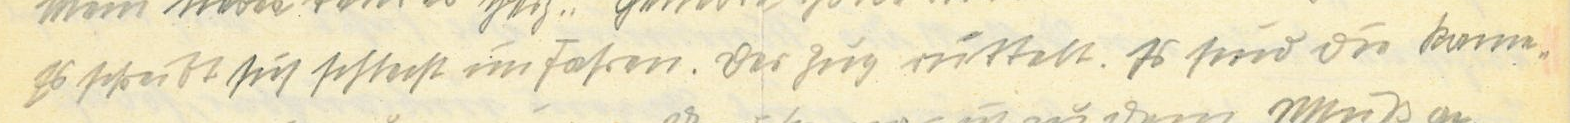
Es schreibt sich schlecht im Fahren. Der Zug rüttelt. Es sind die Kame¬
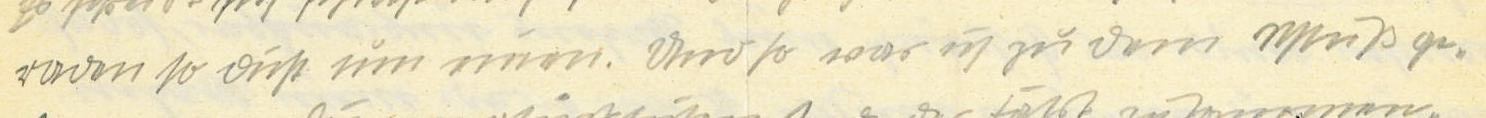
raden so dicht um einen. Und so war ich zu dem Schluß ge¬
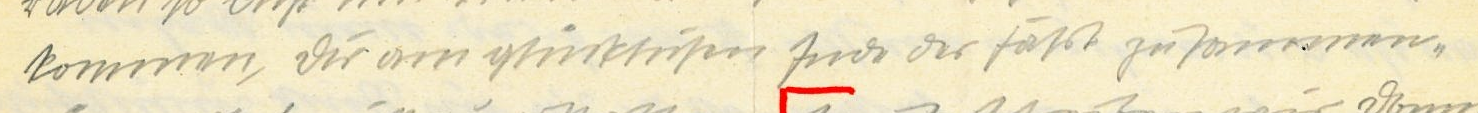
kommen, Dir am glücklichen Ende der Fahrt zusammen¬
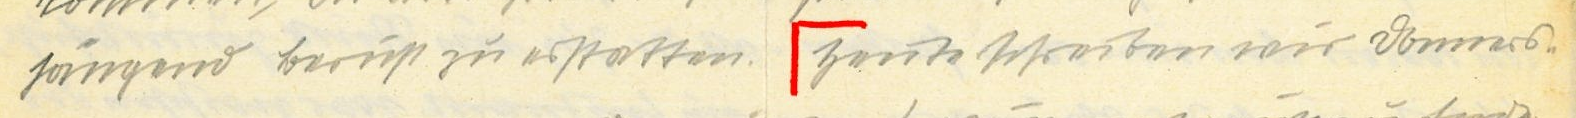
hängend Bericht zu erstatten. Heute schreiben wir Donners¬
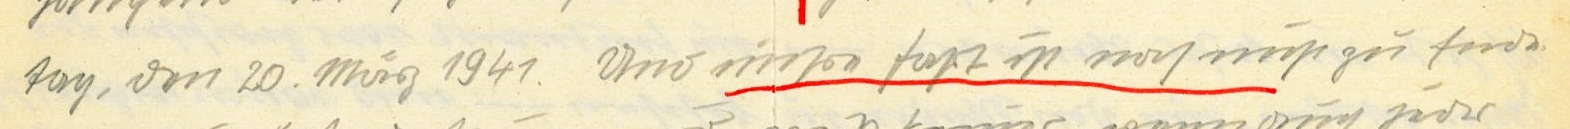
tag, den 20. März 1941. Und unsre Fahrt ist noch nicht zu Ende.
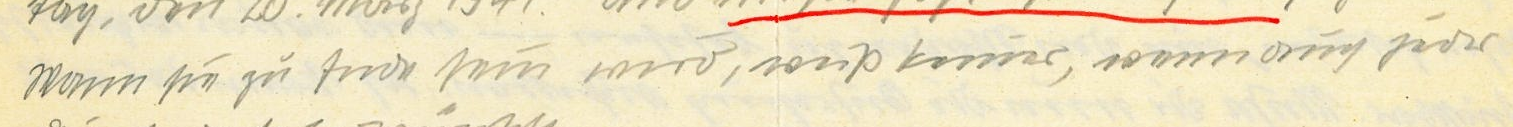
Wann sie zu Ende sein wird, weiß keiner, wenn auch jeder
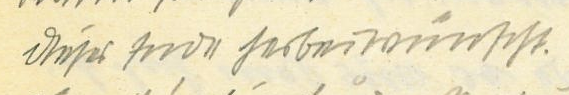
dieses Ende herbeiwünscht.
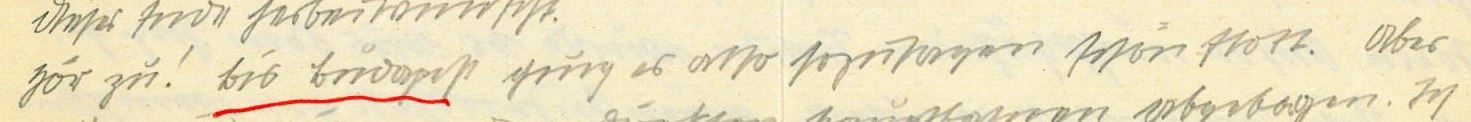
Hör zu! Bis Budapest ging es also sozusagen flott. Aber
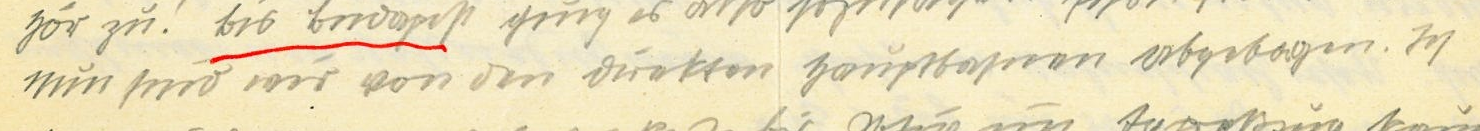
nun sind wir von den direkten Hauptbahnen abgebogen. Ich
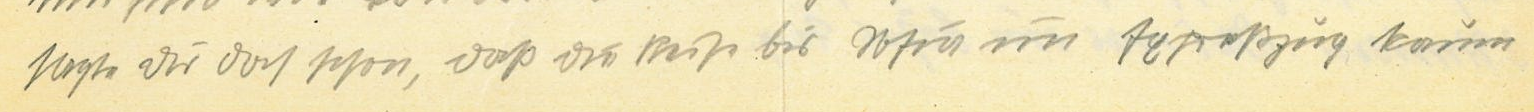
sagte Dir doch schon, daß die Reise bis Sofia im Expreßzug kaum
